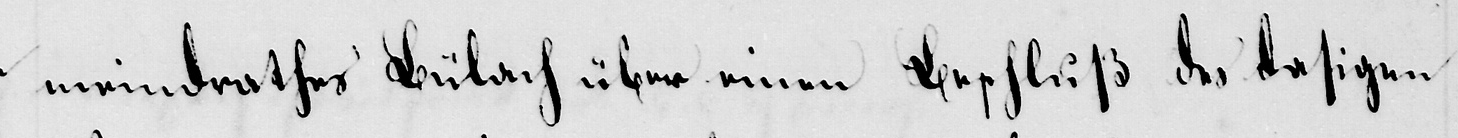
meindrathes Bülach über einen Beschluß des dasigen
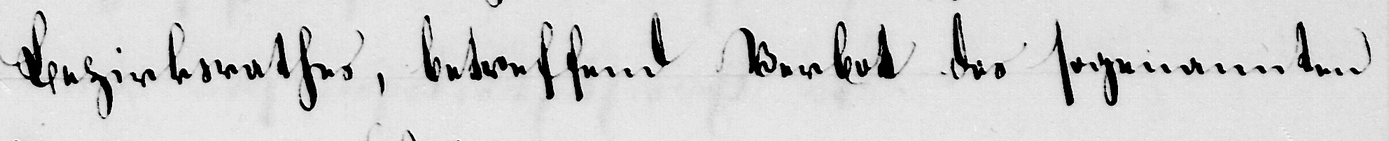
Bezirksrathes, betreffend Verbot des sogenannten
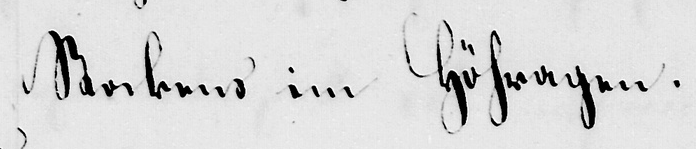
Stockens im Höhragen.
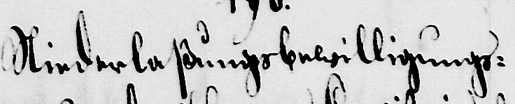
Niederlaßungsbewilliung.
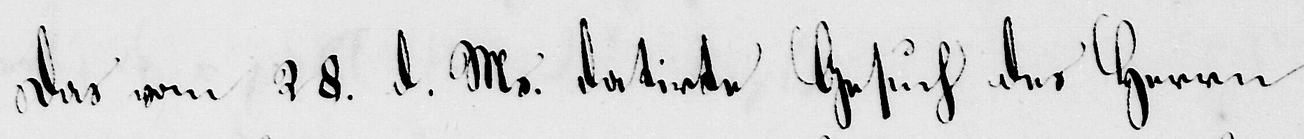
Das vom 28. d. Ms. datirte Gesuch des Herrn
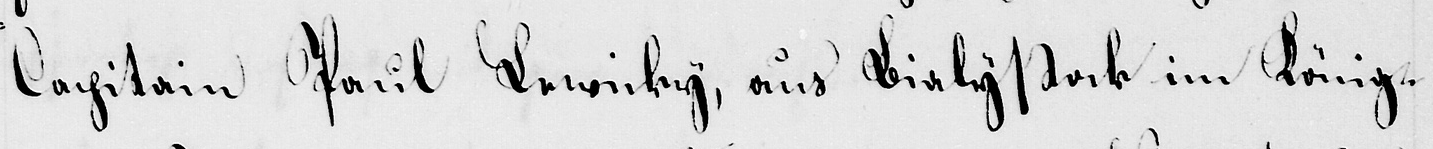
Capitain Paul Lewicky, aus Bialystock im König¬
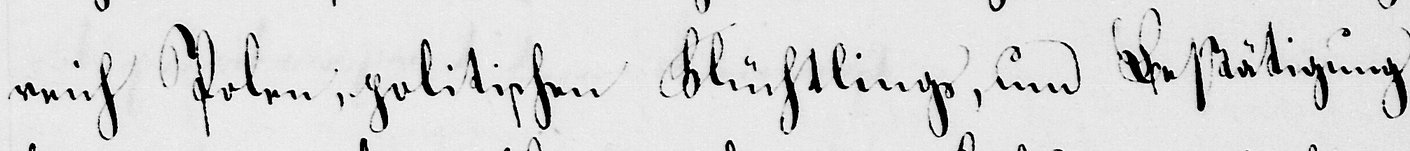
reich Polen; politischen Flüchtlings, um Bestätigung
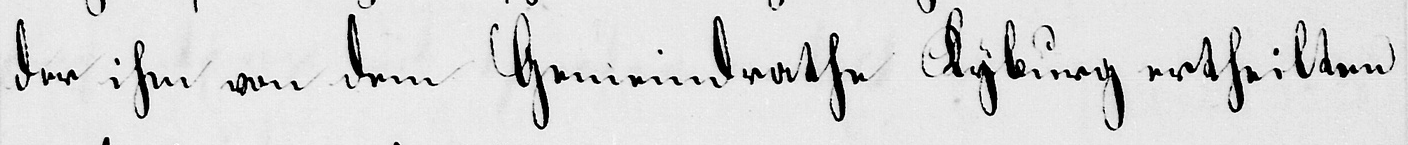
der ihm von dem Gemeindrathe Kyburg ertheilten
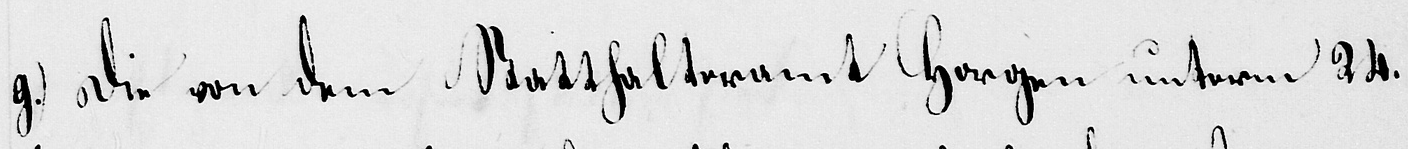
g.) Die von dem Statthalteramt Horgen unterm 24.
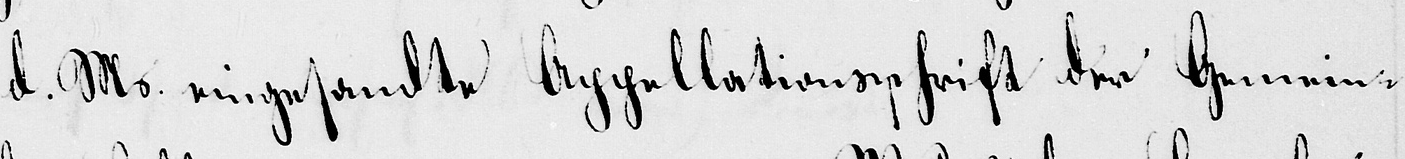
d. Ms. eingesandte Appellationsschrift der Gemein¬
